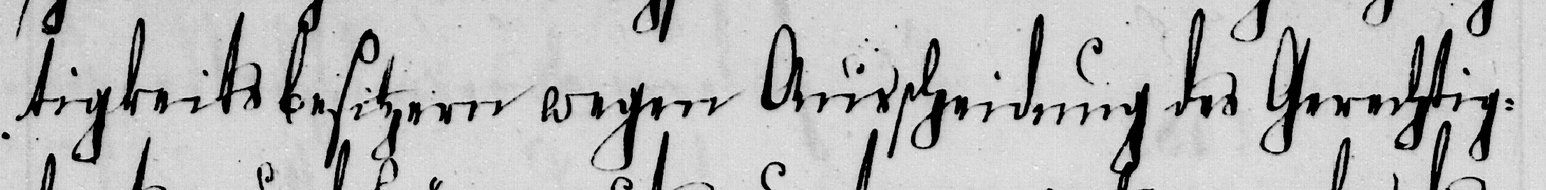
tigkeitsbesitzern wegen Ausscheidung des Gerechtig¬
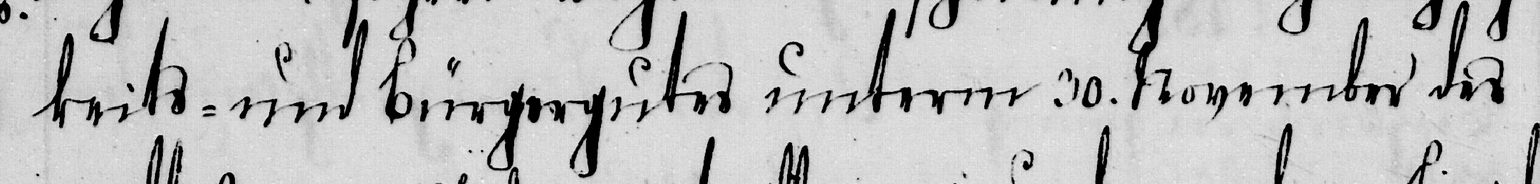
keits- und Bürgergutes unterm 3. November des
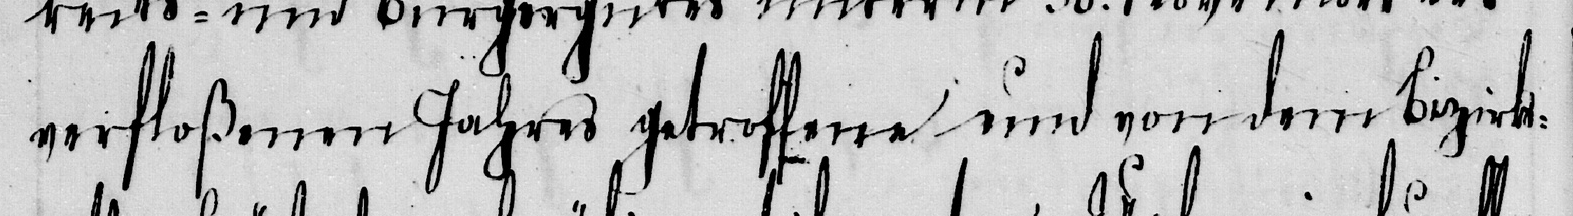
verfloßenen Jahres getroffene und von dem Bezirk¬
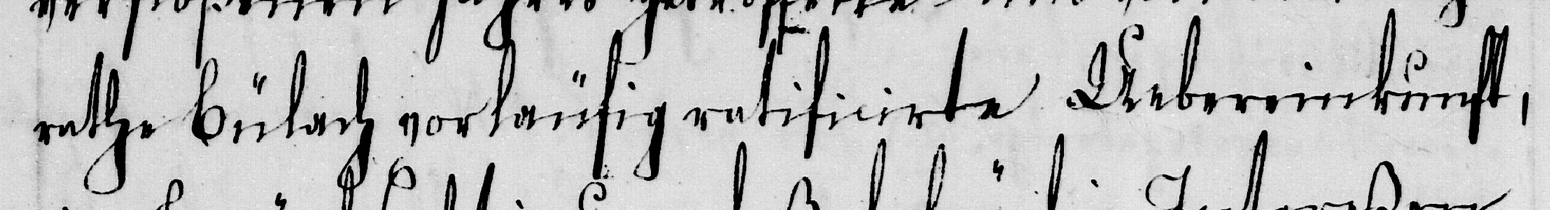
srath Bülach vorläufig ratificirte Uebereinkunft,
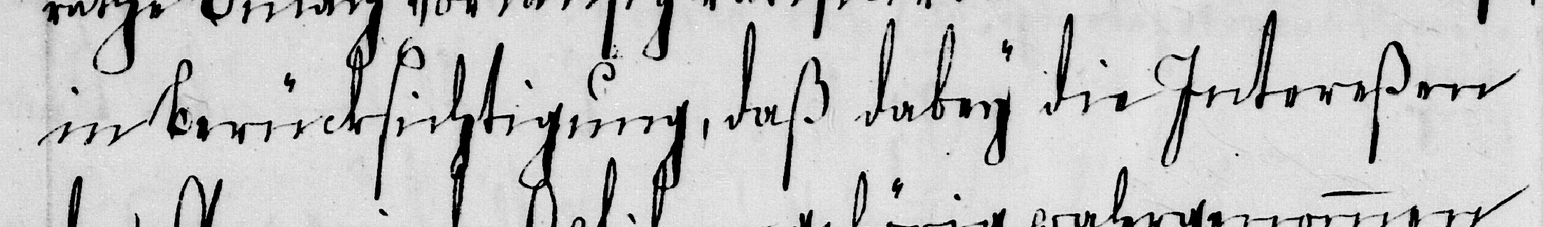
in Berücksichtigung, daß dabey die Intereßen
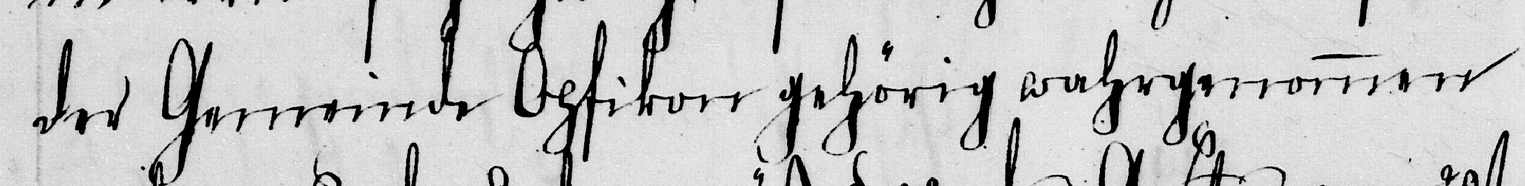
der Gemeinde Opfikon gehörig wahrgenommen
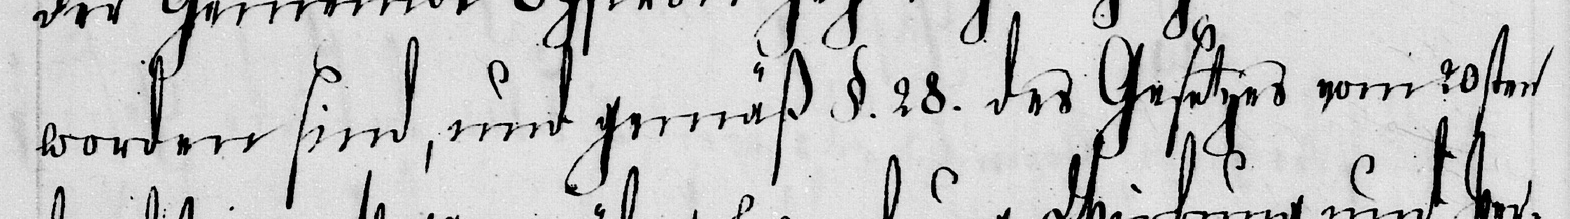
worden sind, und gemäß §. 28. des Gesetzes vom 20sten
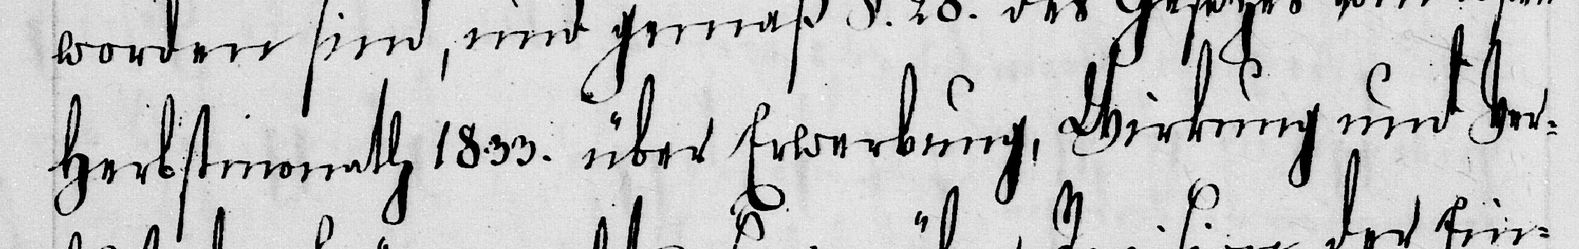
Herbstmonath 1833. über Erwerbung, Wirkung und Ver¬
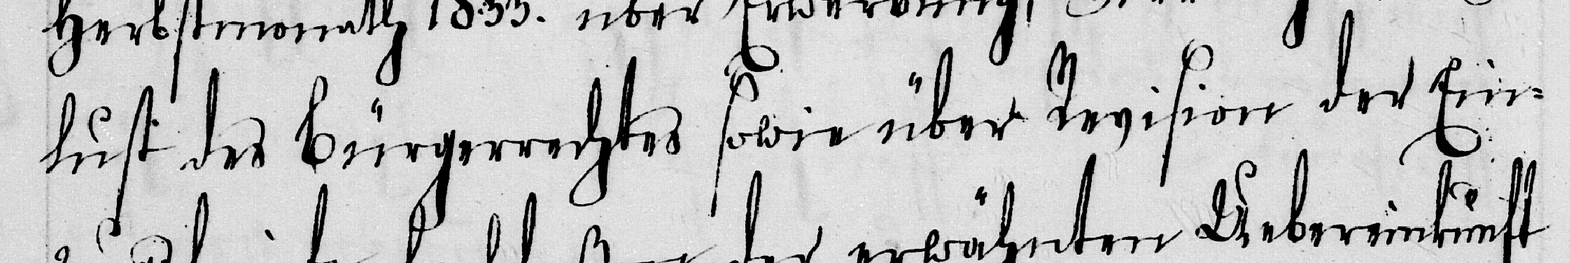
lust des Bürgerrechtes sowie über Revision der Ein¬
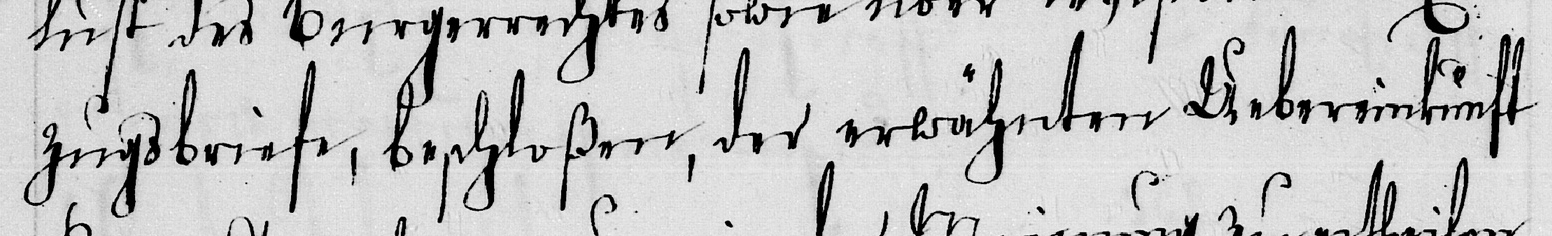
zugsbriefe, beschloßen, der erwähnten Uebereinkunft
